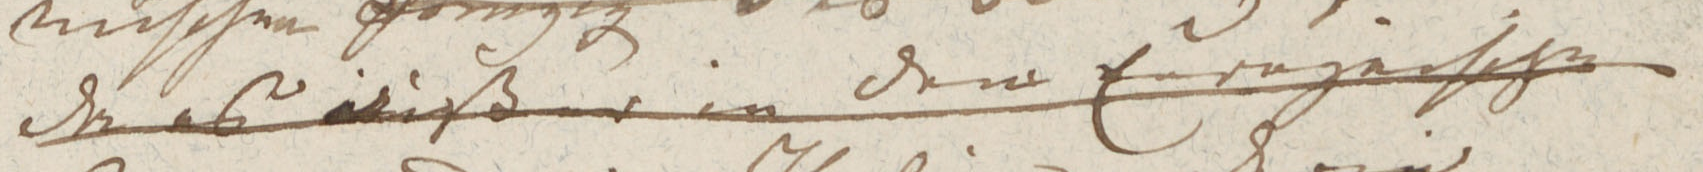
da es ausser in den Europäische
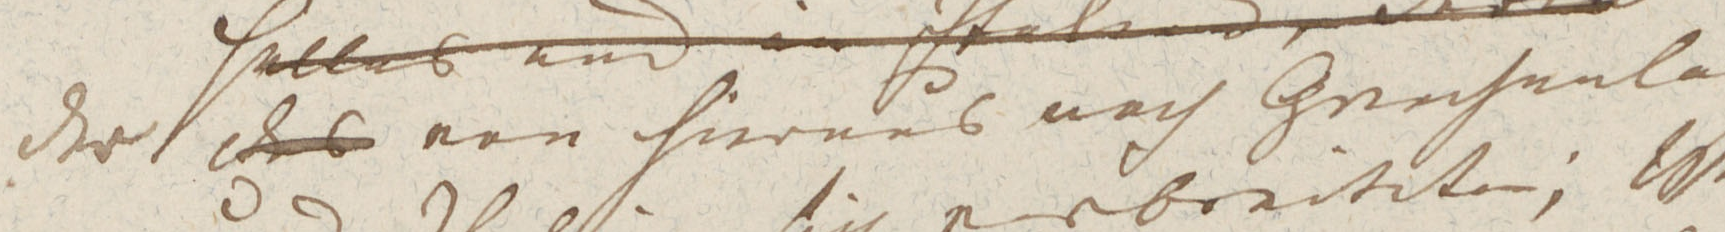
der das von hieraus nach Griechenland
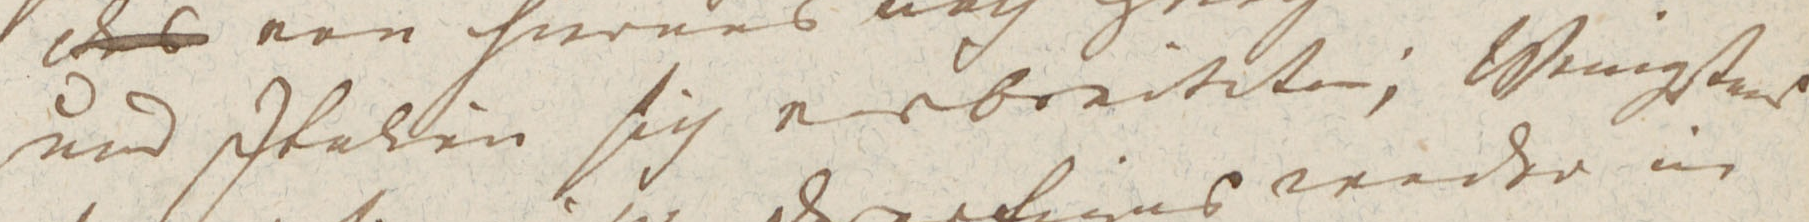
und Italien sich verbreitete; Wenigstens
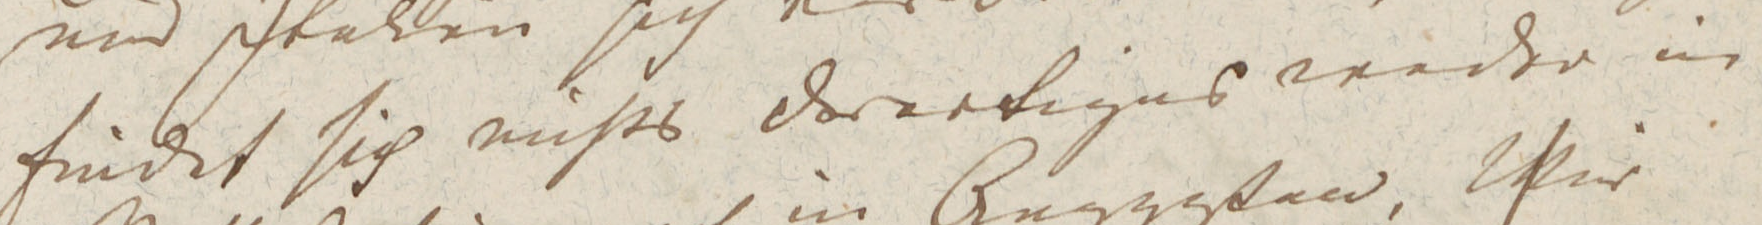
findet sich nichts derartiges weder in
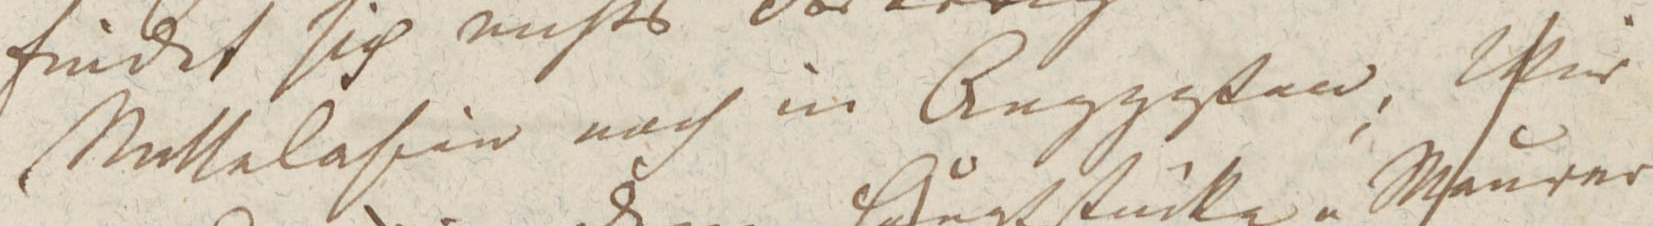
Mittelasien noch in Aegypten; Wir
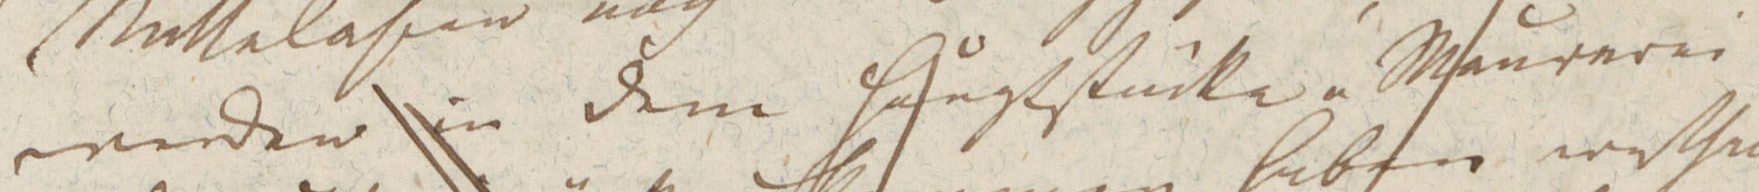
werden in dem Hauptstücke "Maurerei"
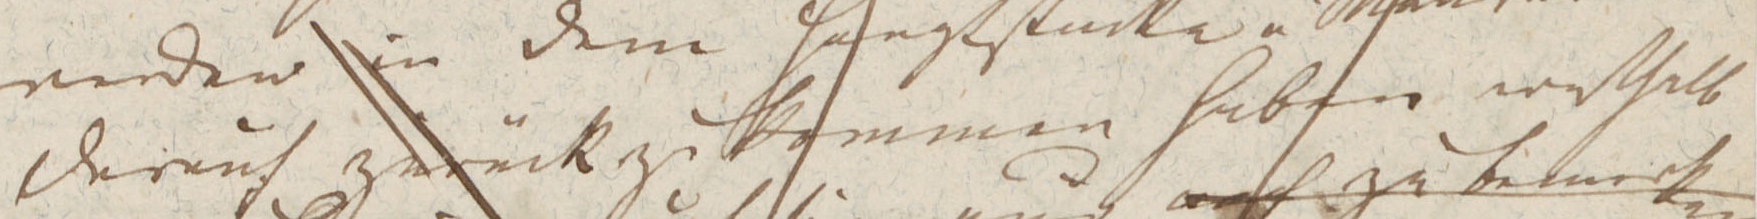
darauf zurückzukommen haben weshalb
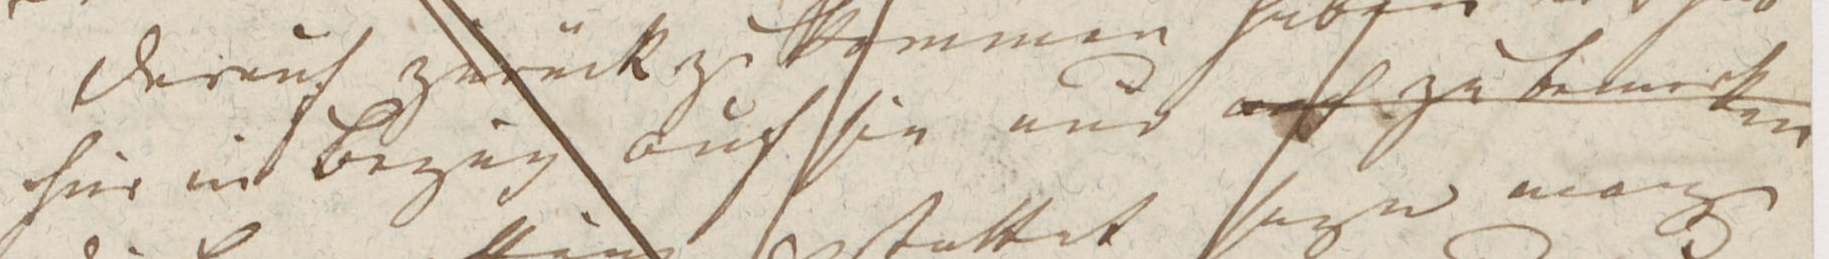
hier in Bezug auf sie nur noch zu bemerken
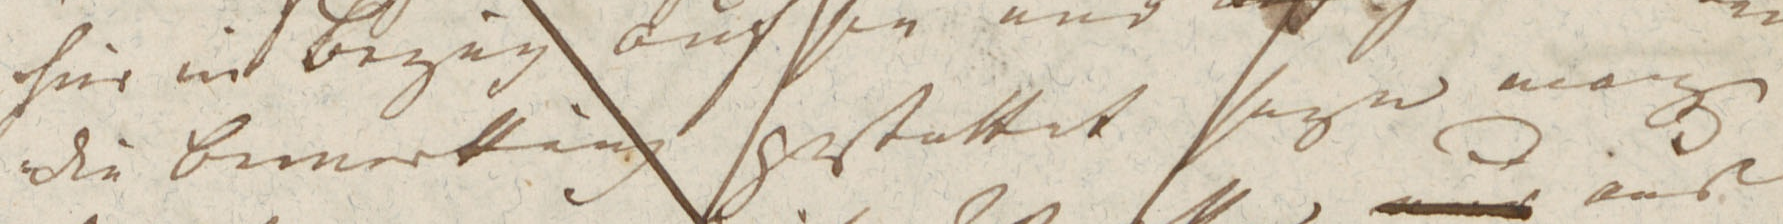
die Bemerkung gestattet seyn mag
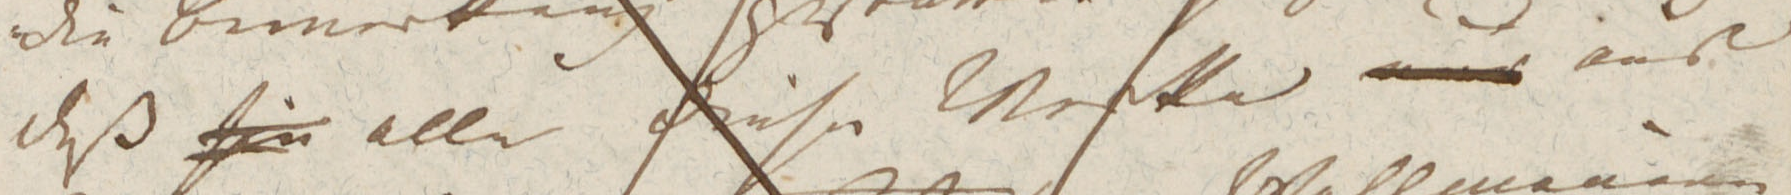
dass sie alle diese Werke nur aus
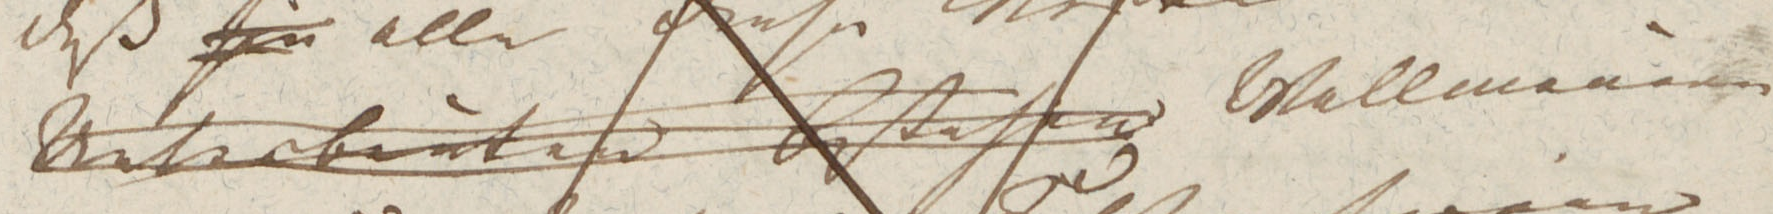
Unterbauten bestehen Wallmauern
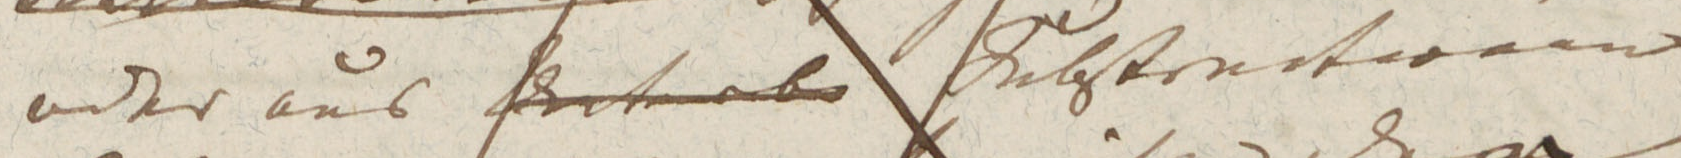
oder aus Unterb Substructionen
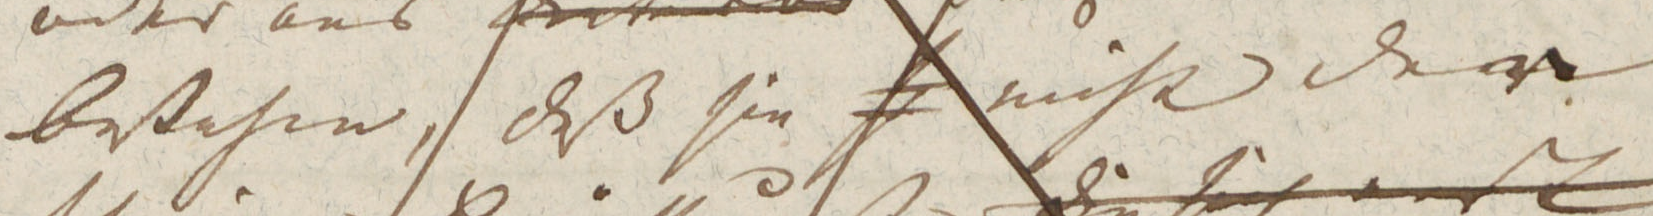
bestehen, dass sie s nicht demr
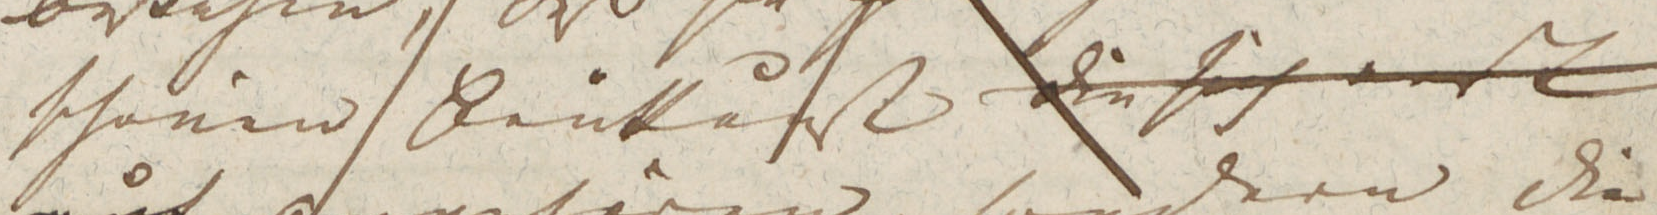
schönen Baukunst die sich erst
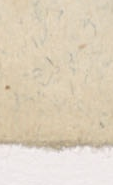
die
